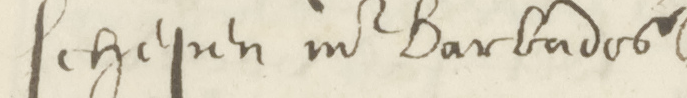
Schepen in Barbados
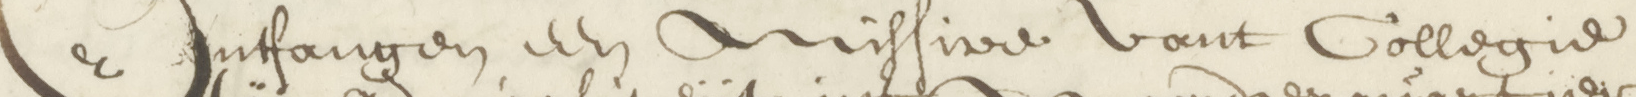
Ontfangen een Missive vant Collegie
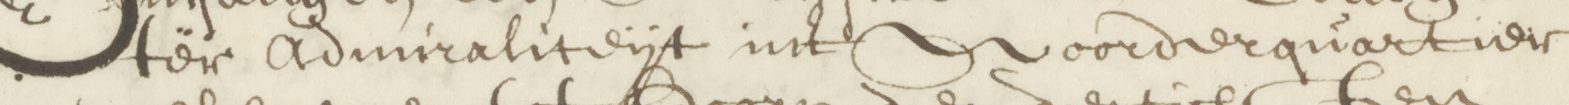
ter Admiraliteijt int Noorderquartier
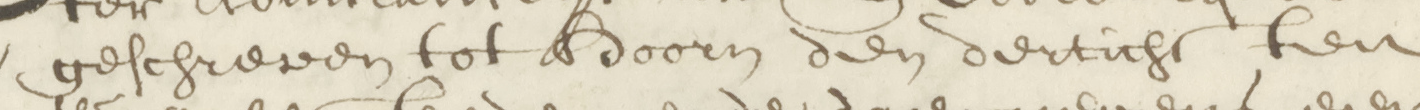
geschreven tot Hoorn den dertichsten
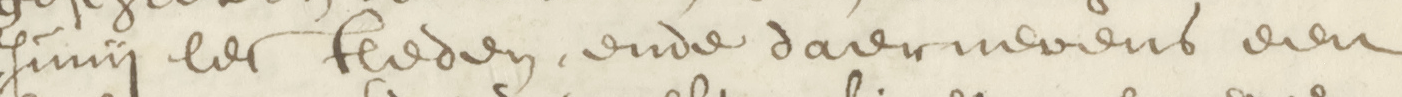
Junij lestleden, ende daernevens een
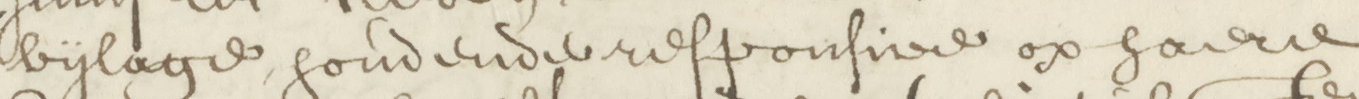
bijlage, houdende responsive op haere
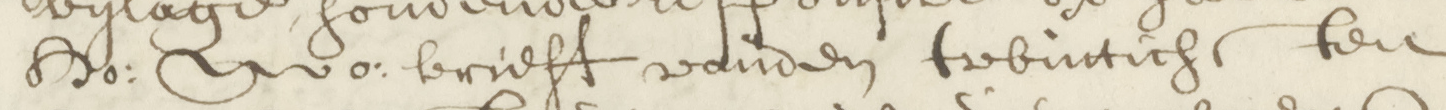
Ho:Mo: brieff vanden twintichsten
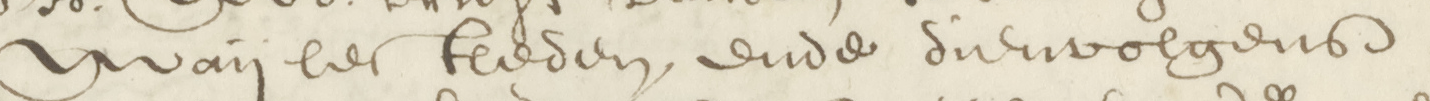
Maij lestleden ende dienvolgens
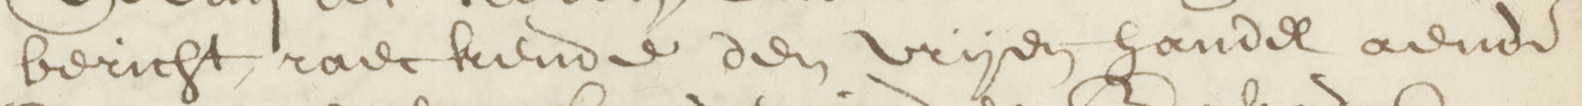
bericht, raeckende den vrijen handel aende
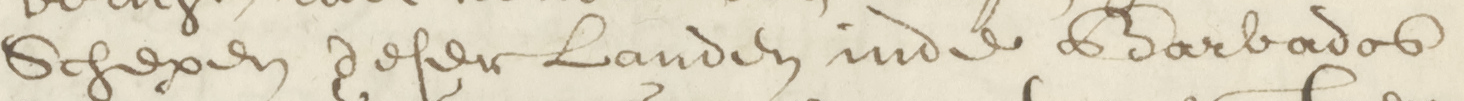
Schepen deser Landen inde Barbados
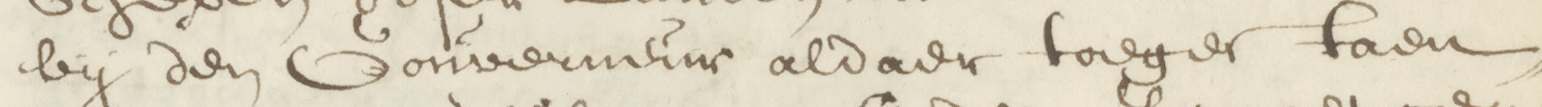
bij den Gouverneur aldaer toegestaen.
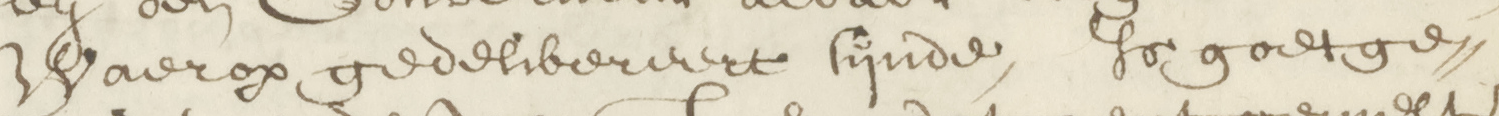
Waerop gedelibereert sijnde, Is goetge„
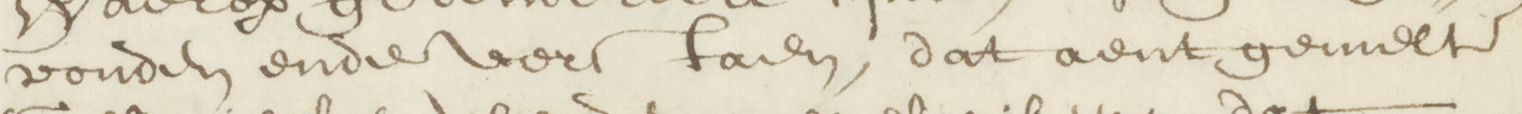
vonden ende verstaen, dat aent gemelte
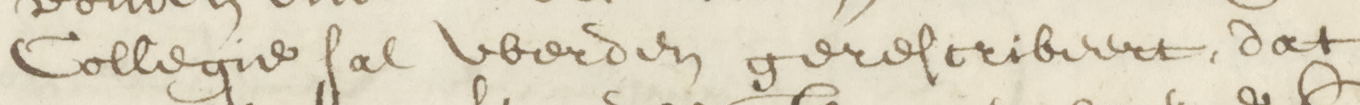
Collegie sal werden gerescribeert, dat
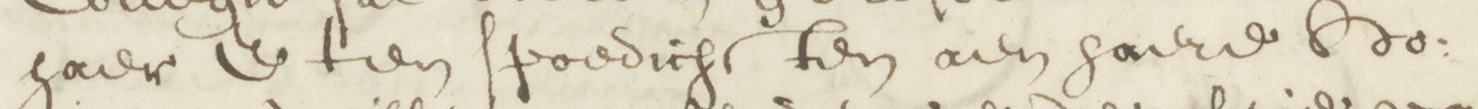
haer E ten spoedichsten aen haere Ho:
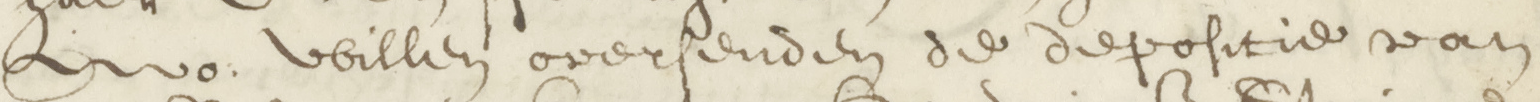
Mo: willen oversenden de depositie van
